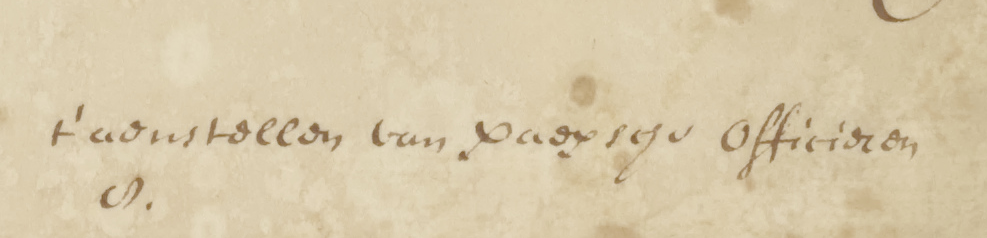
t'aenstellen van paepsche officieren
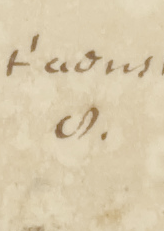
8.
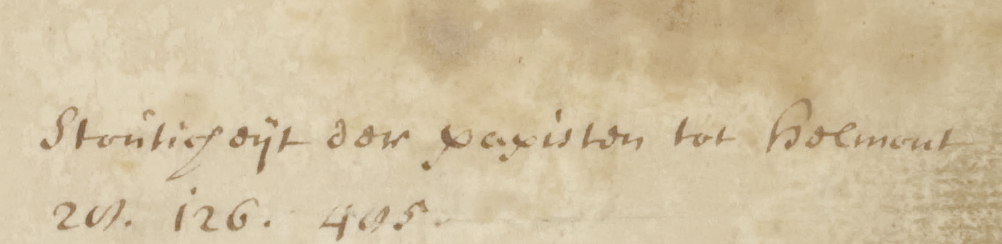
stouticheijt der papisten tot Helmont
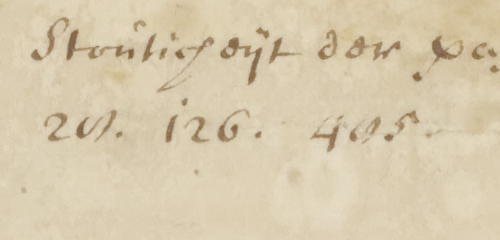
28, 126, 485
